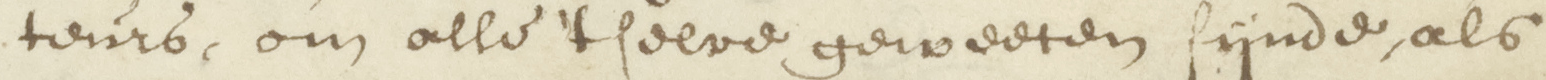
teurs, om alle 't selve geweeten sijnde, als
